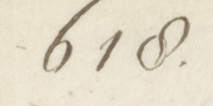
618.
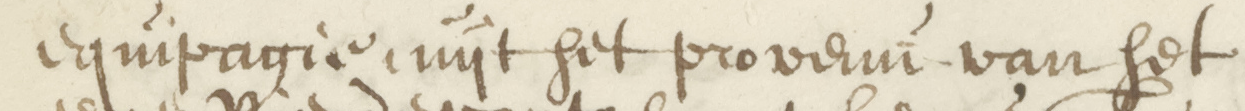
equipagie uijt het provenu van het
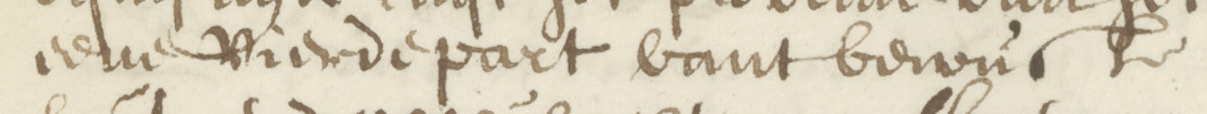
eene Vierde part vant bewuste
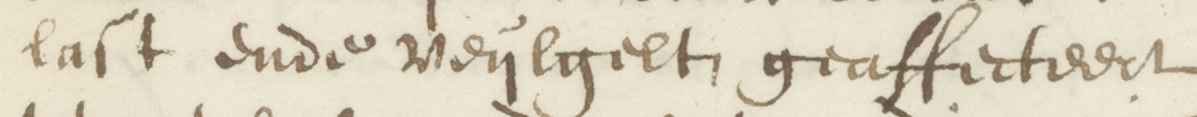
last ende Veijlgelt, geaffecteert
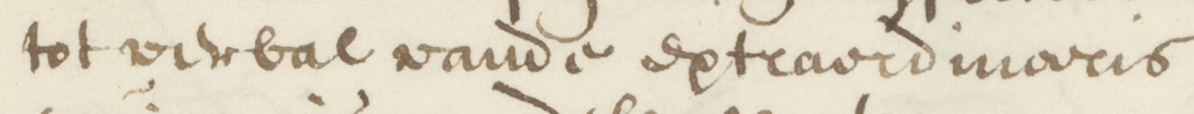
tot verval vande extraordinaris
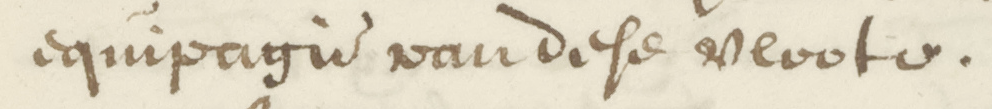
equipagie van dese Vloote.
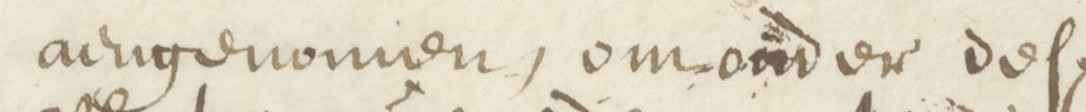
aengenomen, om onder dese
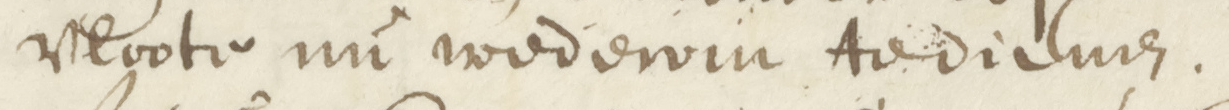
Vloote nu wederom te dienen.
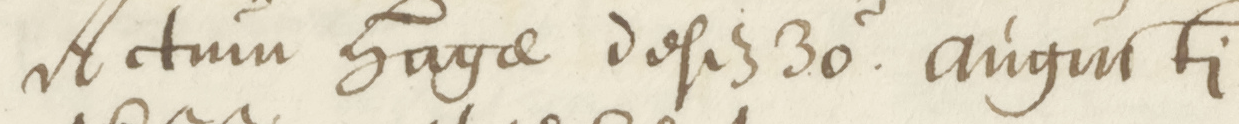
Actum Hage desen 30en Augusti
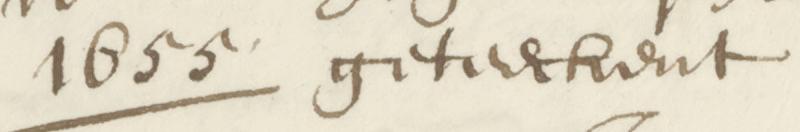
1655 geteeckent
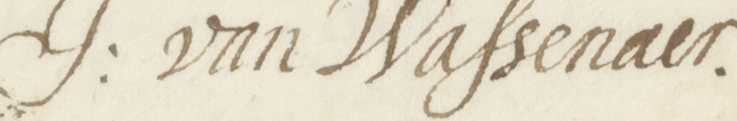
J: van Wassenaer.
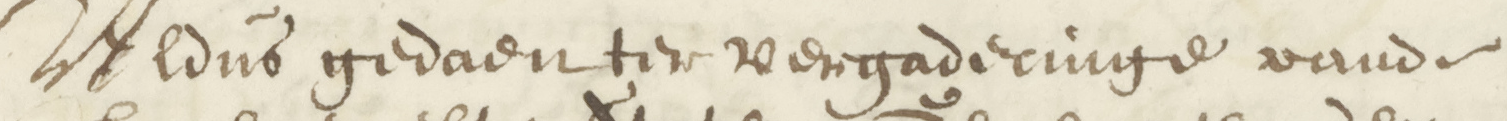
Aldus gedaen ter vergaderinge vande
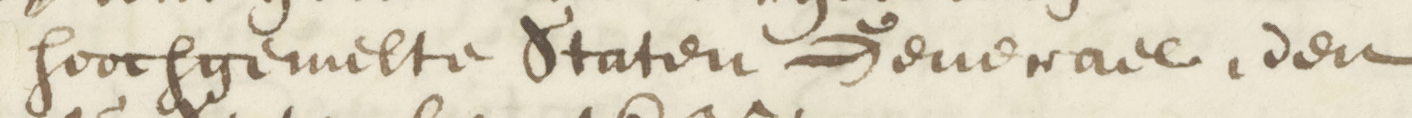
hoochgemelte Staten Generael, den
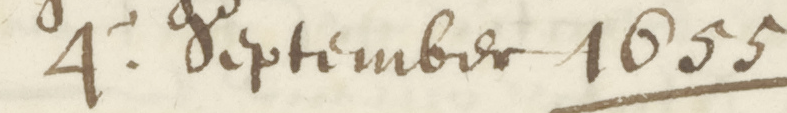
4e. September 1655.
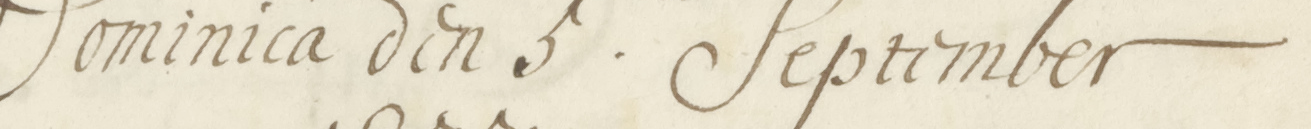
Dominica den 5en. September
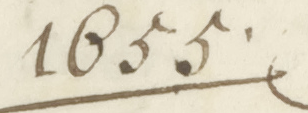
1655.
